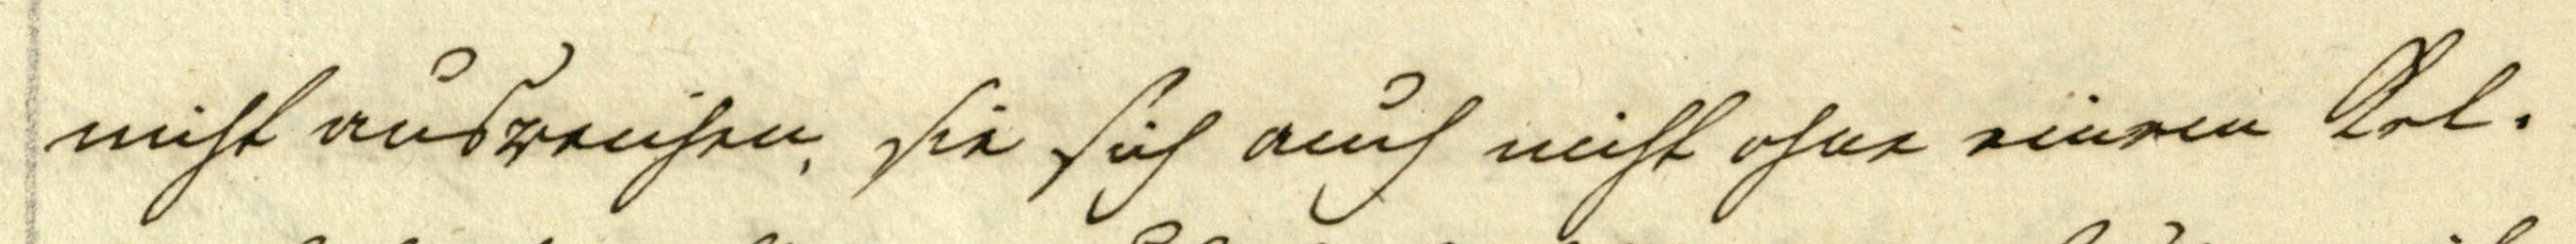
nicht ausreichen, sie sich auch nicht ohne einem Kel¬
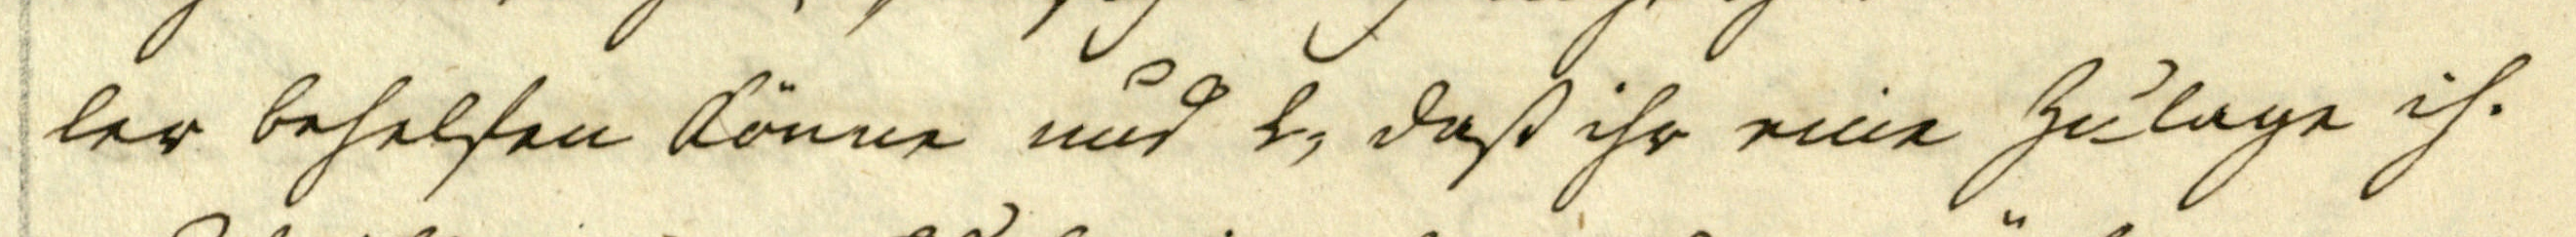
ler behelfen könne und 2, daß ihr eine Zulage ih¬
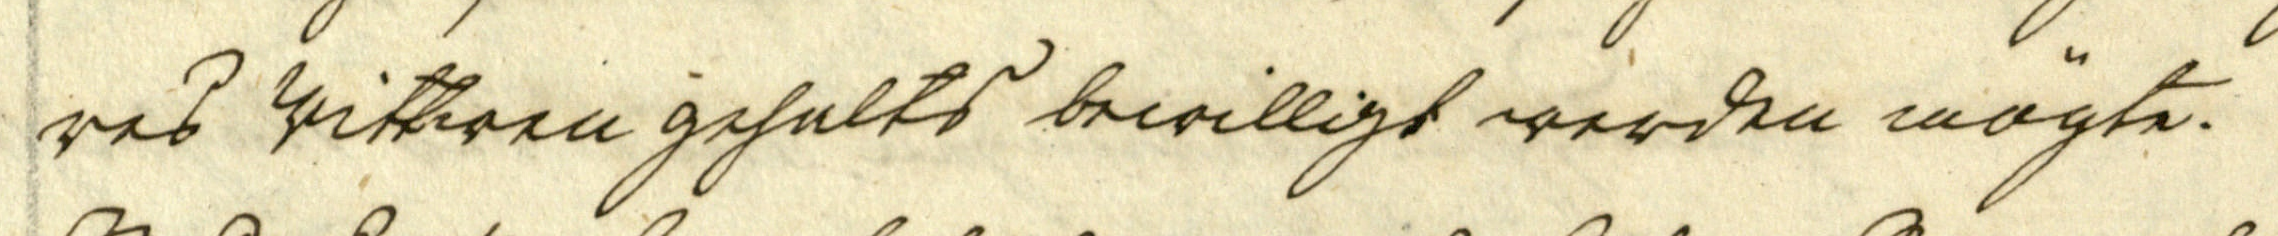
res Wittwen gehalts bewilligt werden mögte.
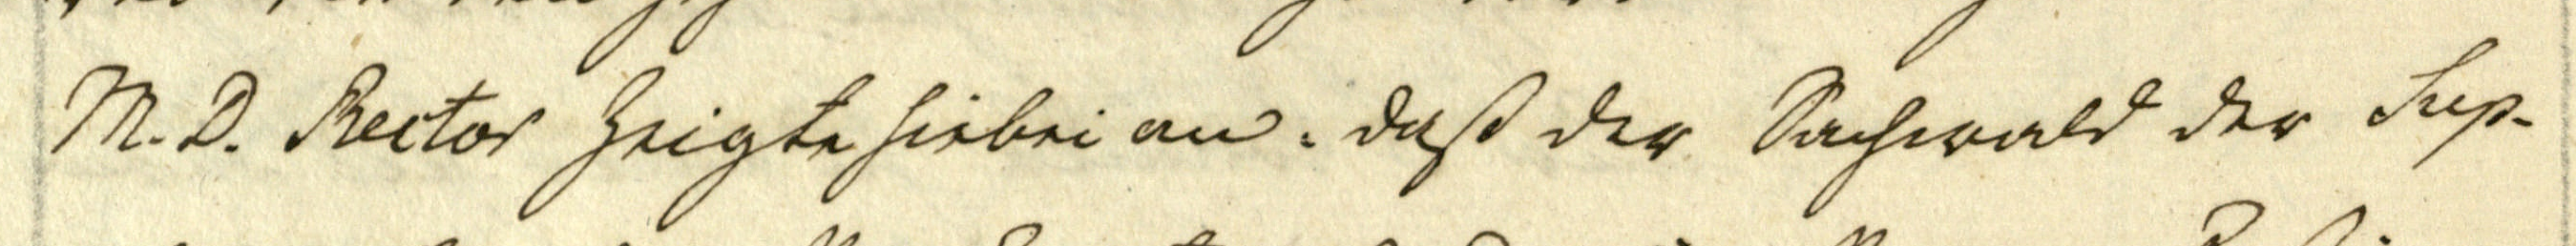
M. D. Rector zeigte hiebei an: daß der Sachwald der Sup¬
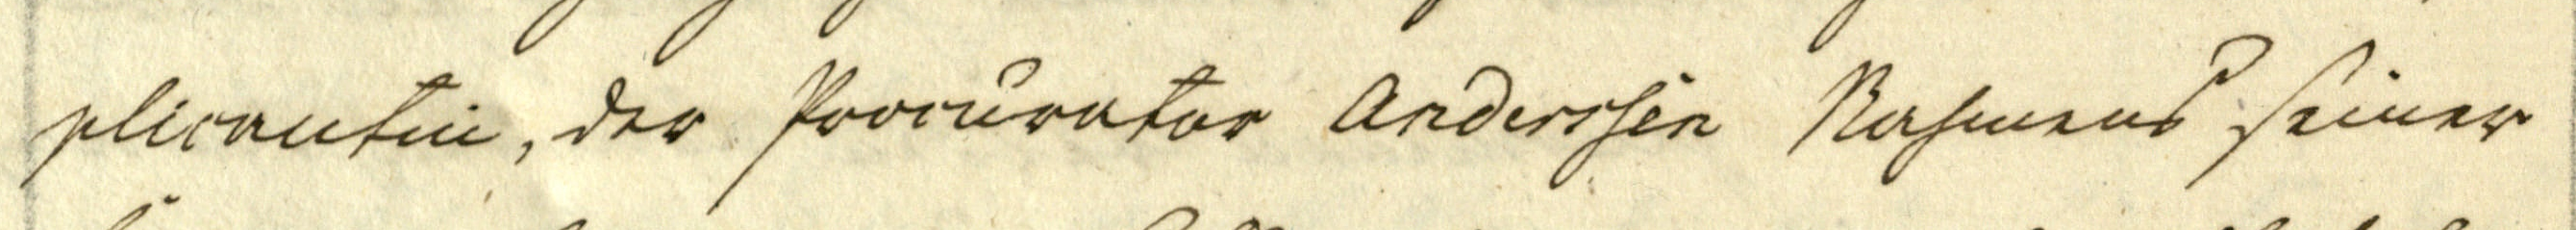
plicantin, der Procurator Anderssen Nahmens seiner
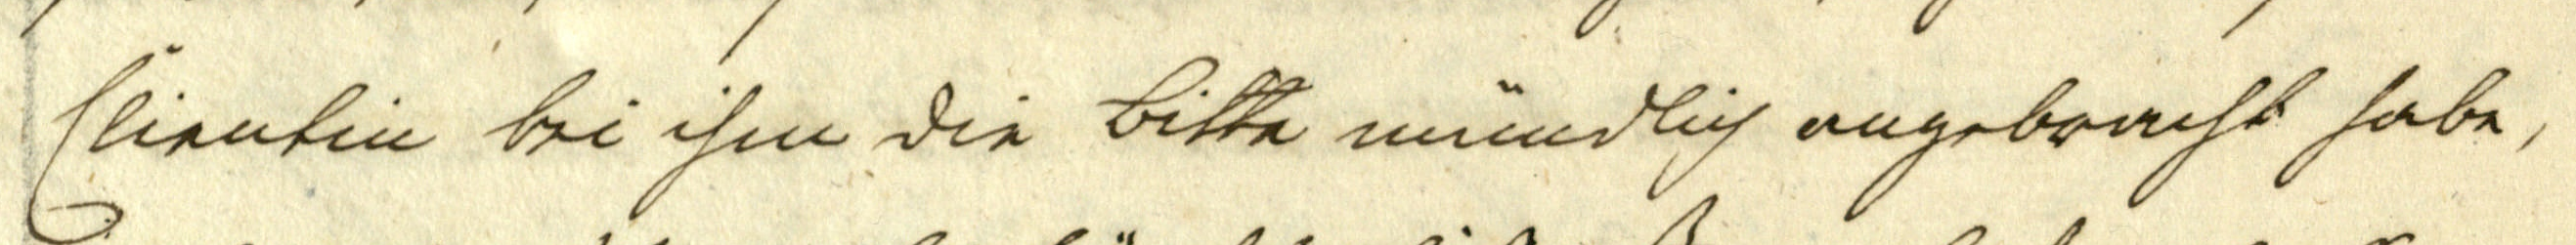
Clientin bei ihm die Bitte mündlich angebracht habe,
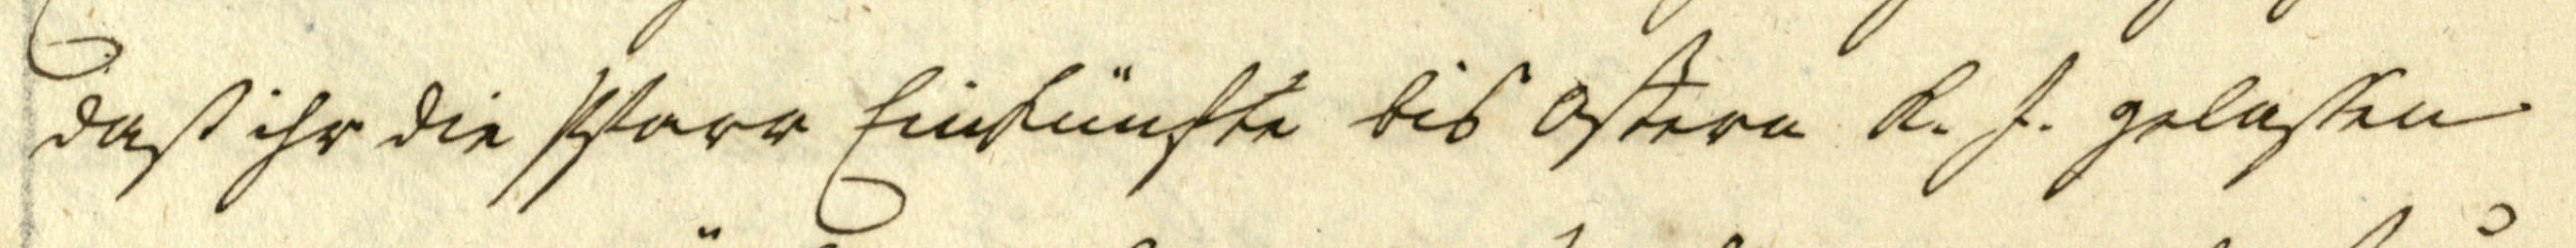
daß ihr die Pfarr Einkünfte es Ostern k. J. gelassen
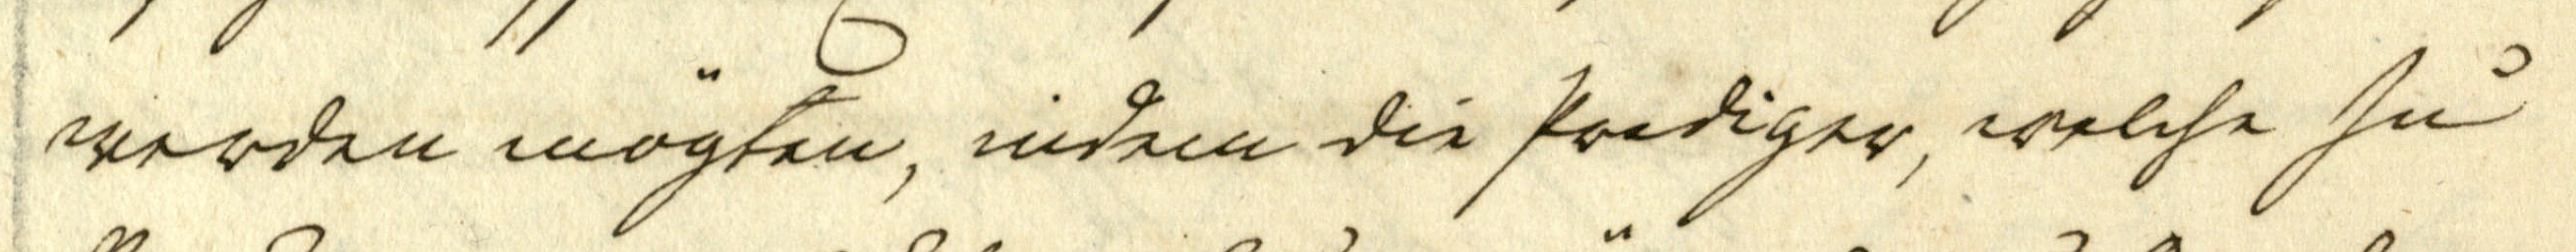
werden mögten, indem die Prediger, welche zu
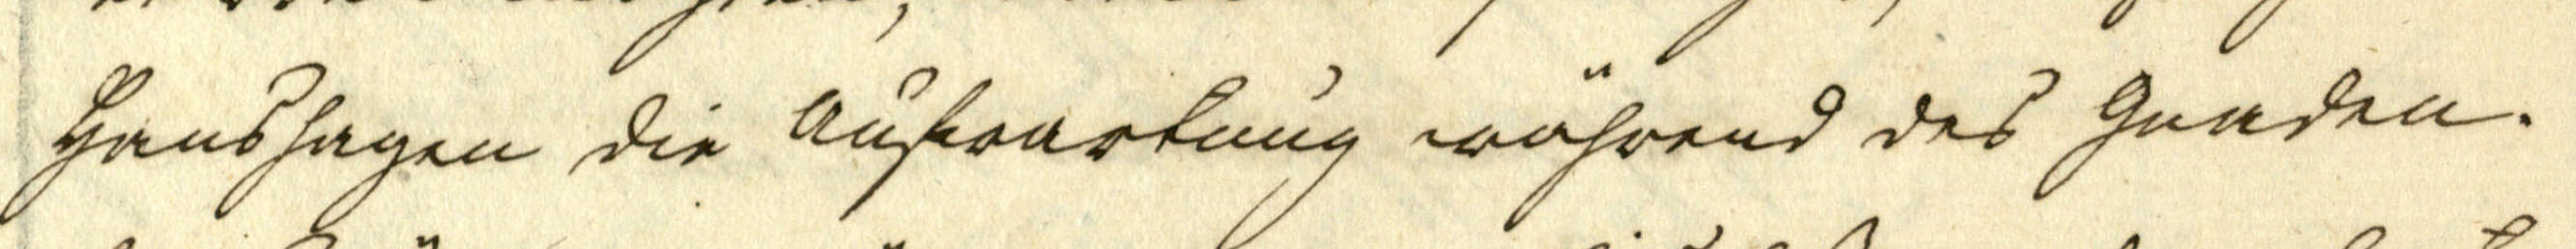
Hanshagen die Aufwartung während des Gnaden¬
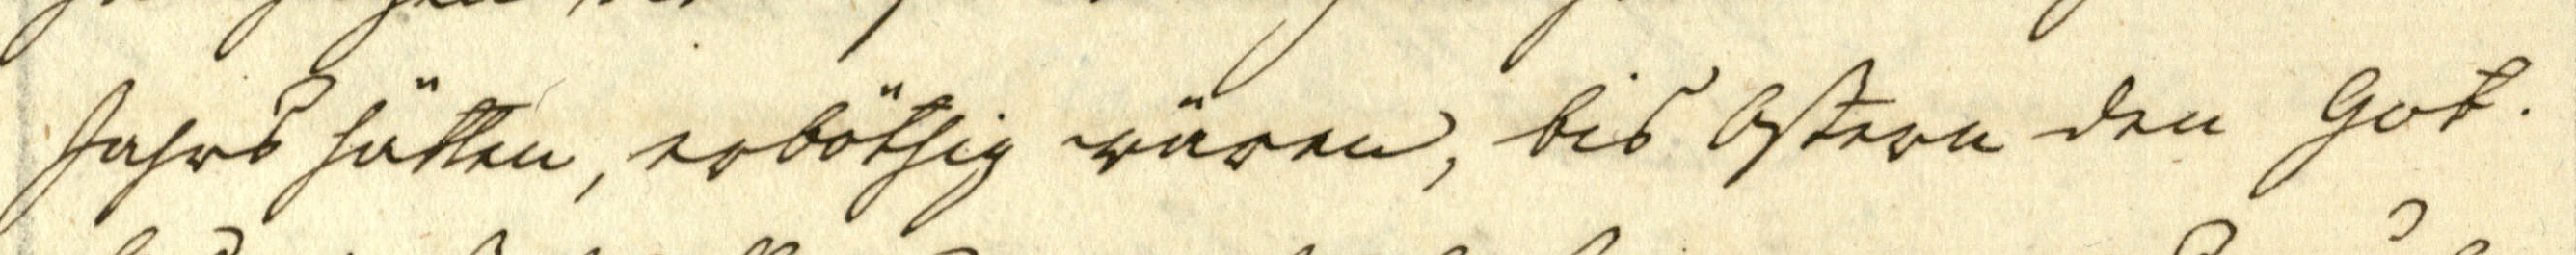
Jahres hätten, erböthig wären, bis Ostern den Got¬
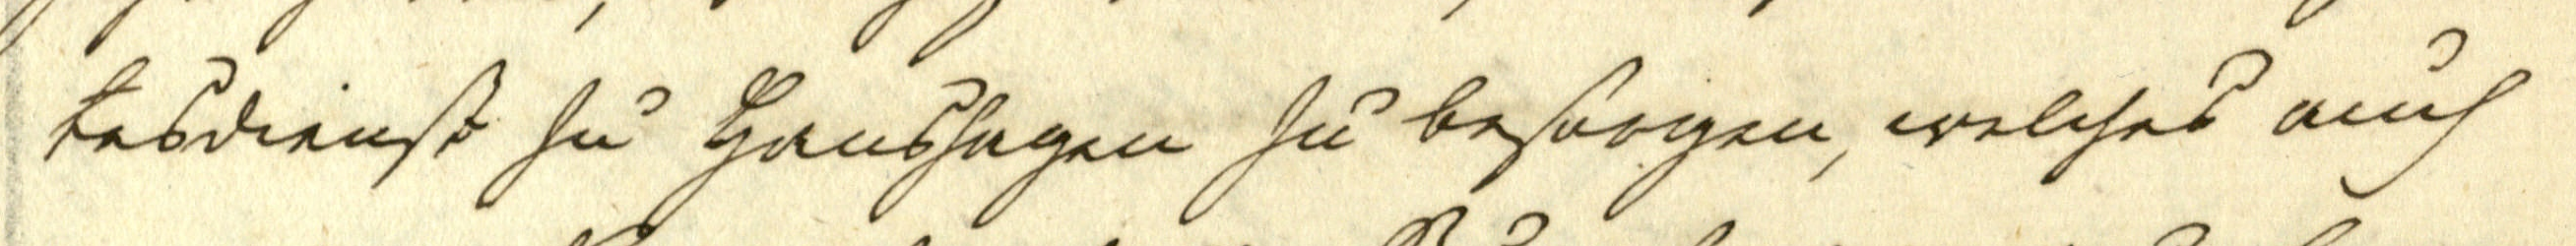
tesdienst zu Hanshagen zu besorgen, welches auch
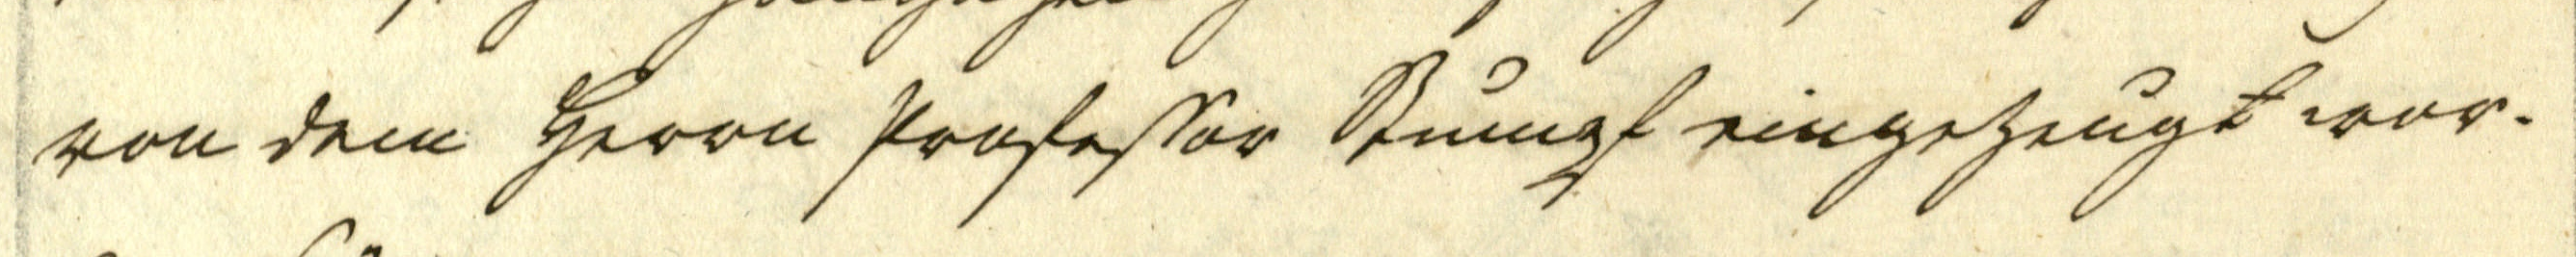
von dem Herrn Professor Stumpf eingezeugt wor¬
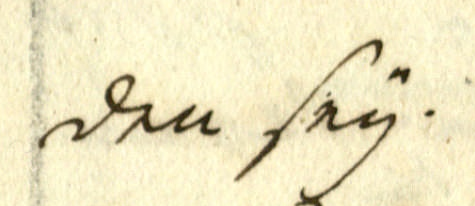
den seÿ.
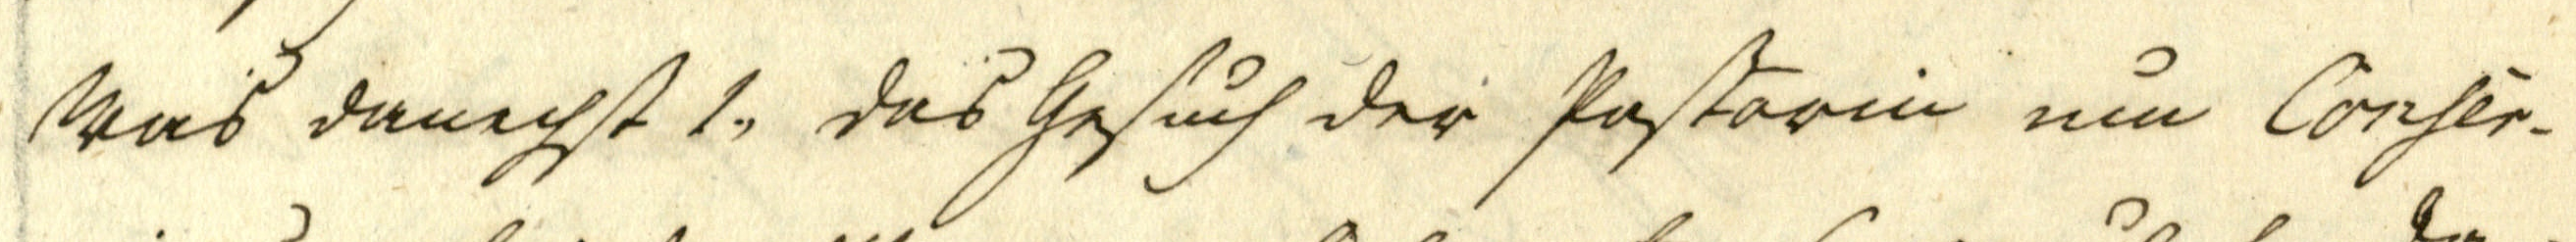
Was danechst 1, das Gesuch der Pastorin um Conser¬
